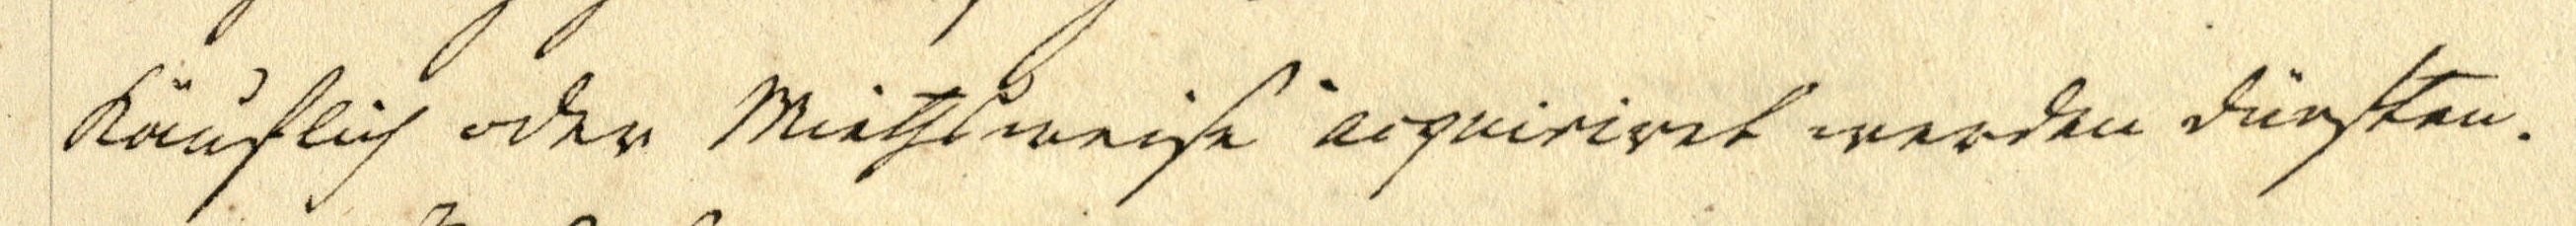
käuflich oder Miethsweise acquiriret werden dürften.
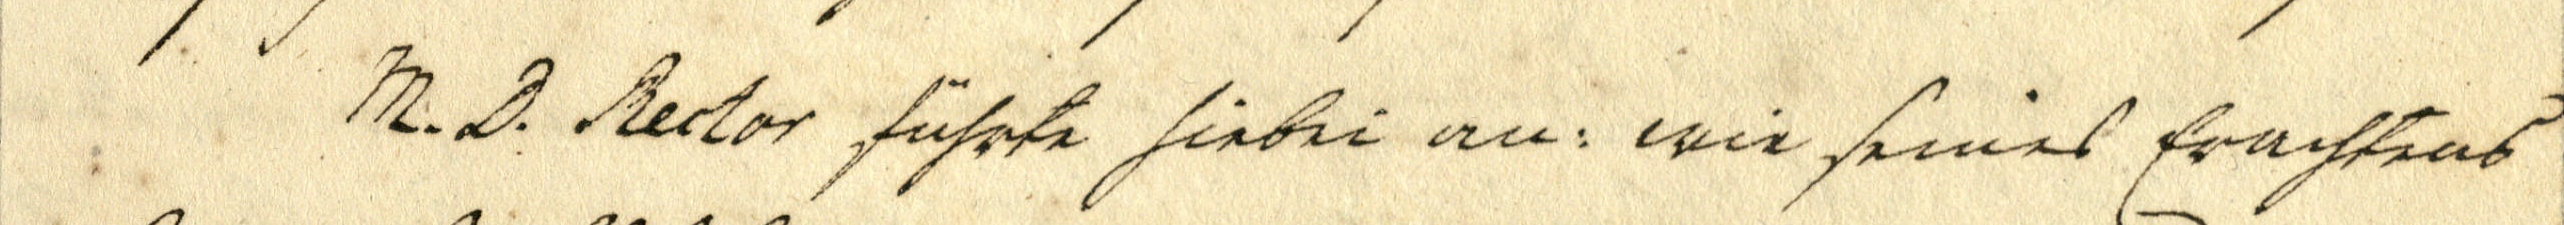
M. D. Rector führte hiebei an: wie seines Erachtens
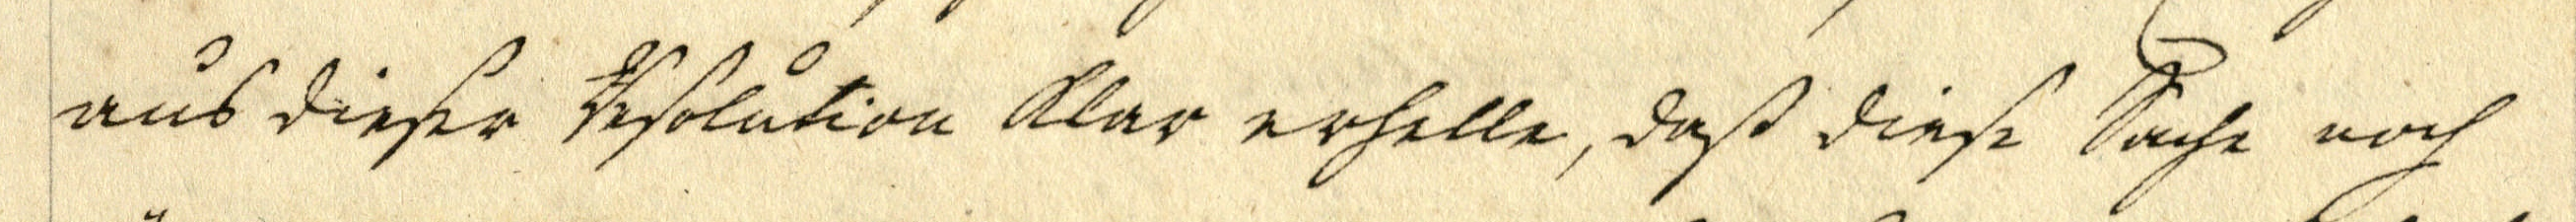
aus dieser Resolution klar erhelle,daß diese Sache noch
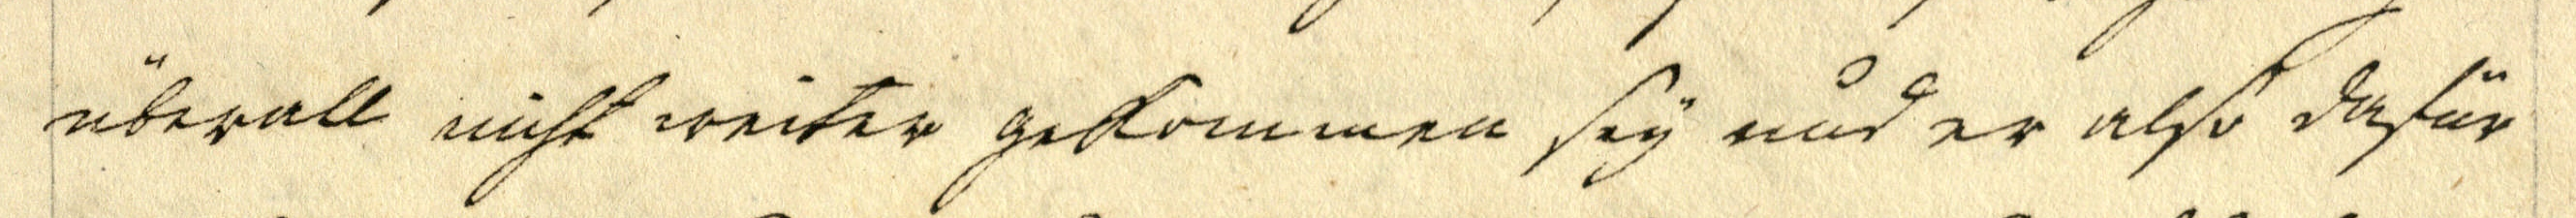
überall nicht weiter gekommen seÿ und er also dafür
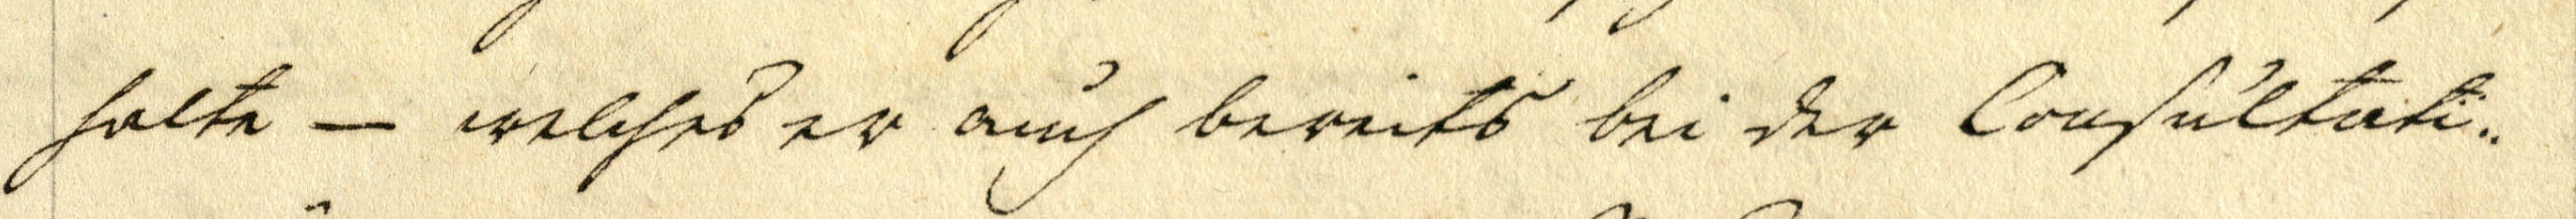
halte - welches er auch bereits bei der Consultati¬
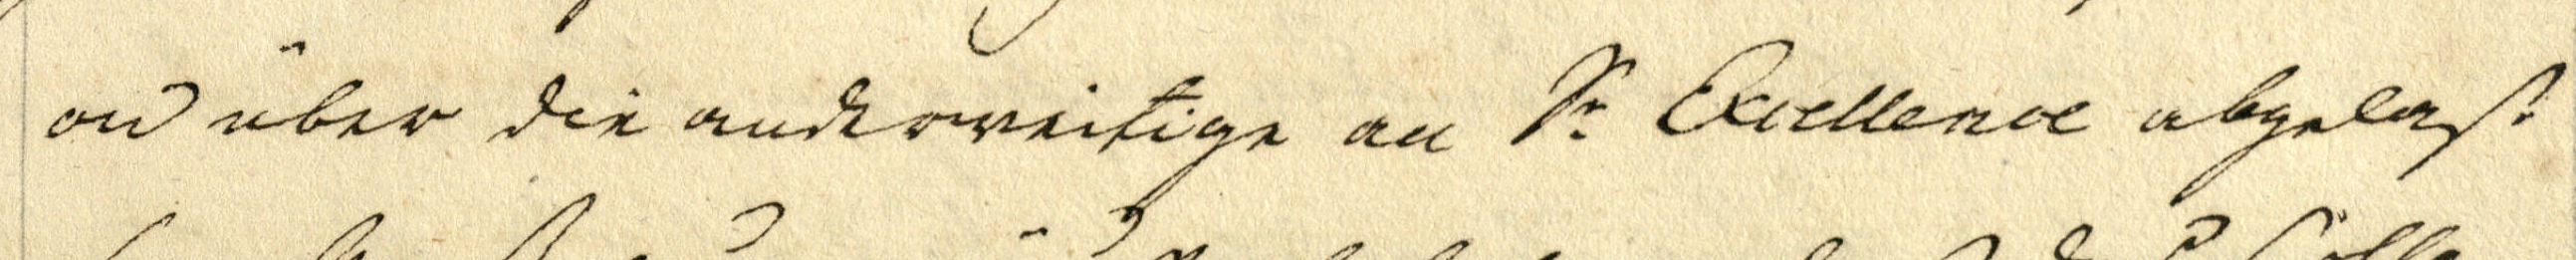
on über die anderweitige an Sr. Excellence abgelas¬
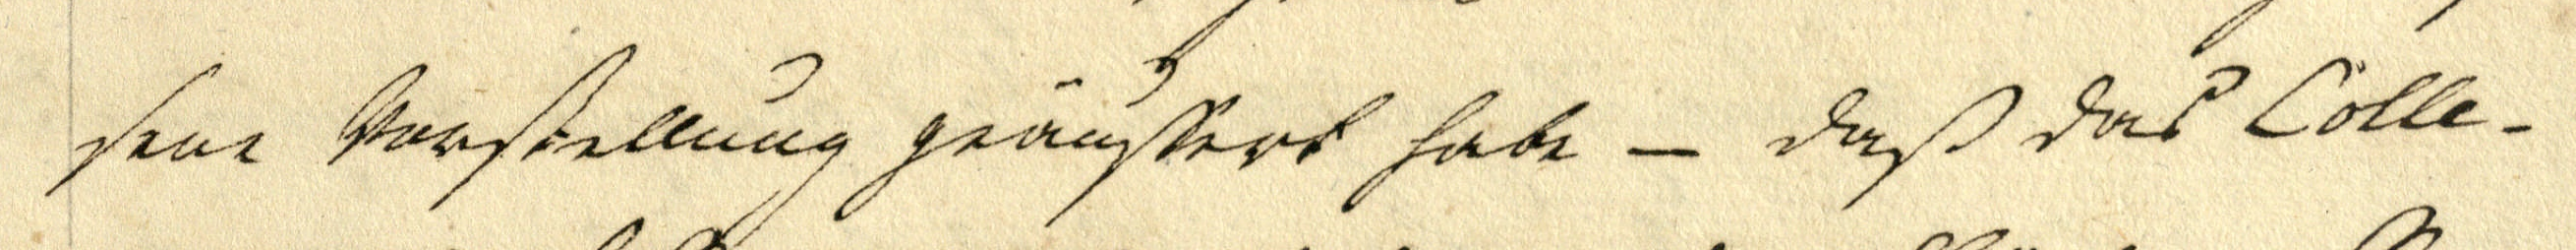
sene Vorstellung geäussert habe - daß das Colle¬
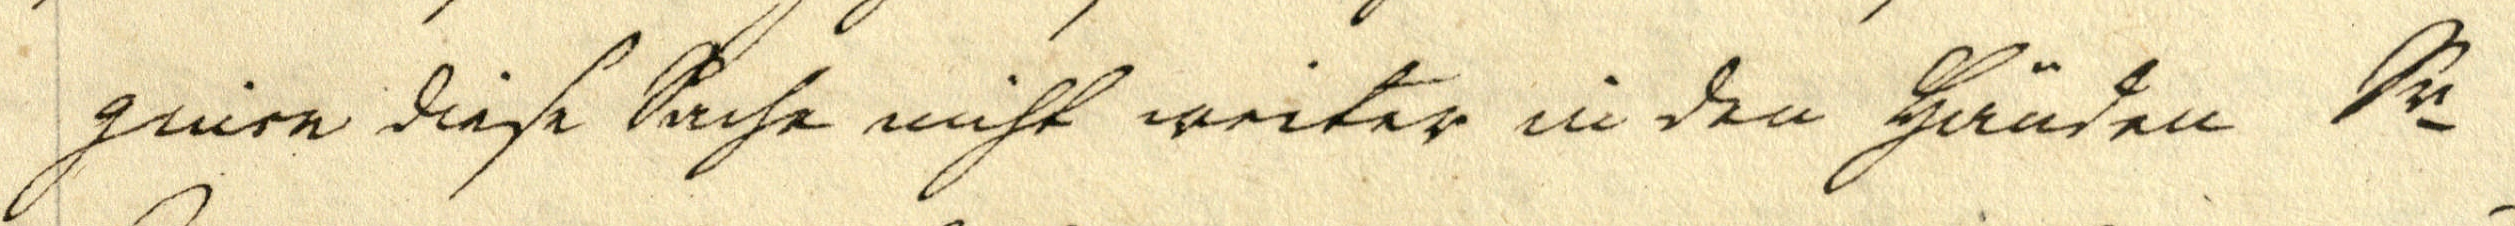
gium diese Sache nicht weiter in den Händen Sr.
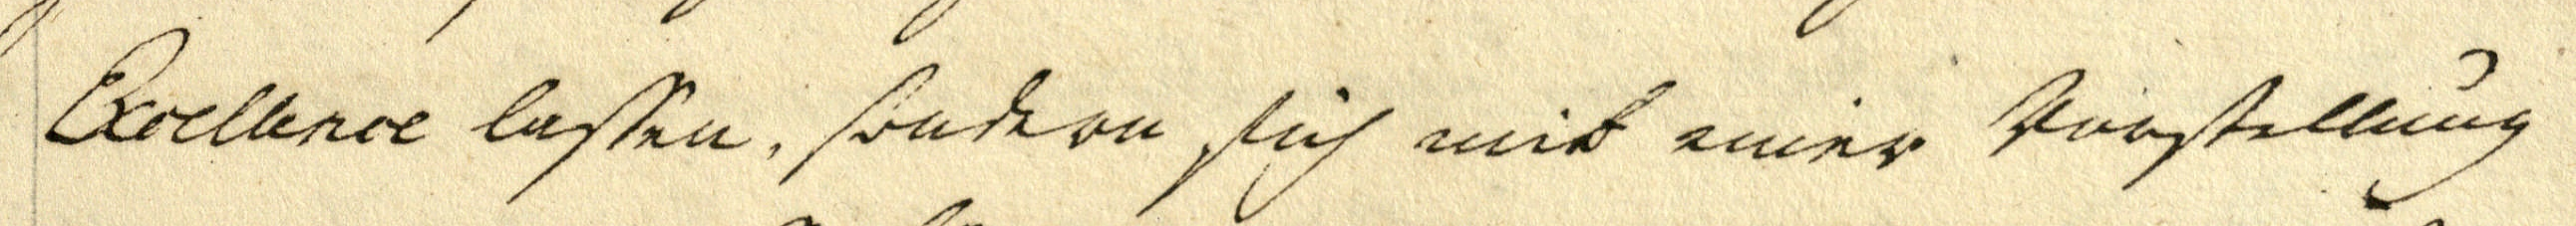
Excellence lassen, sondern sich mit einer Vorstellung
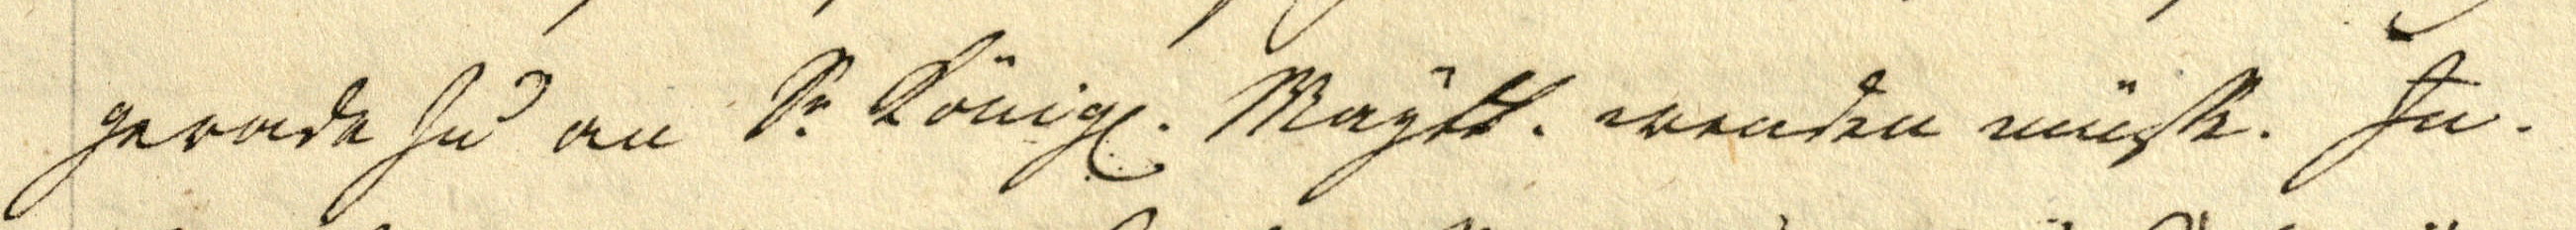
geradezu an Sr. Königl. Maÿtt. wenden müste. In¬
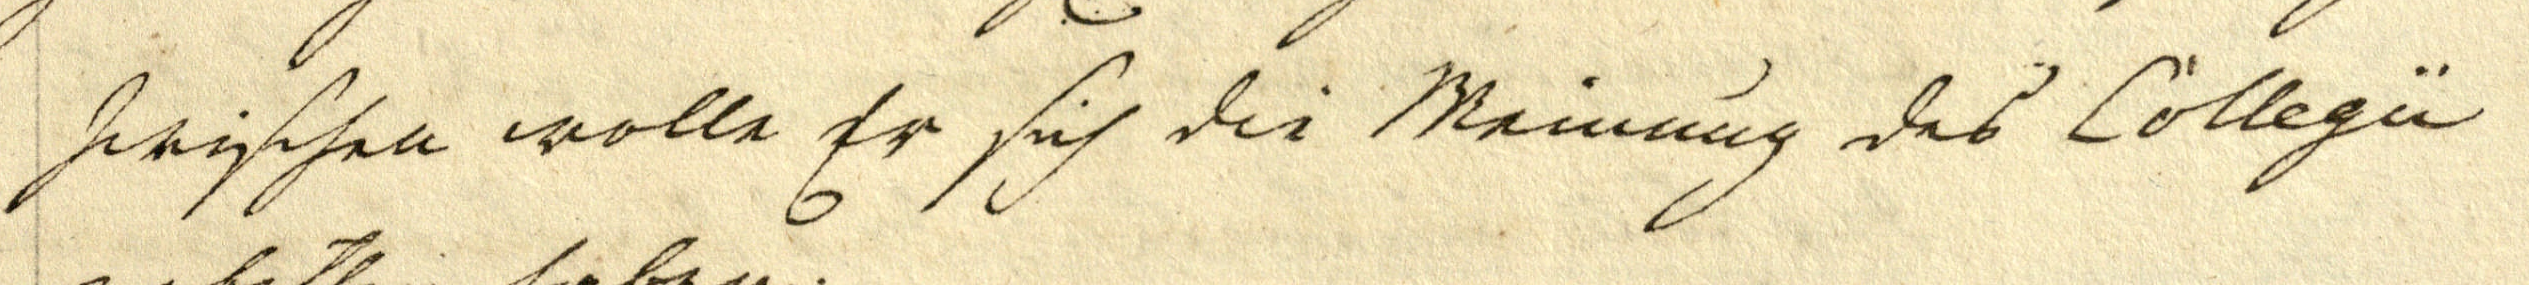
zwischen wolle Er sich die Meinung des Collegii
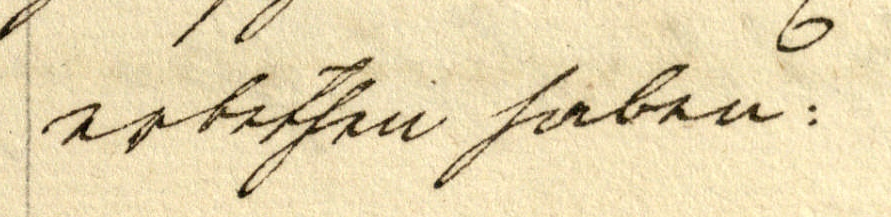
erbethen haben:
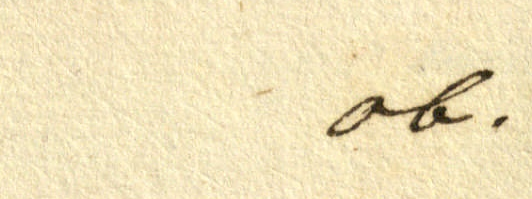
ob
